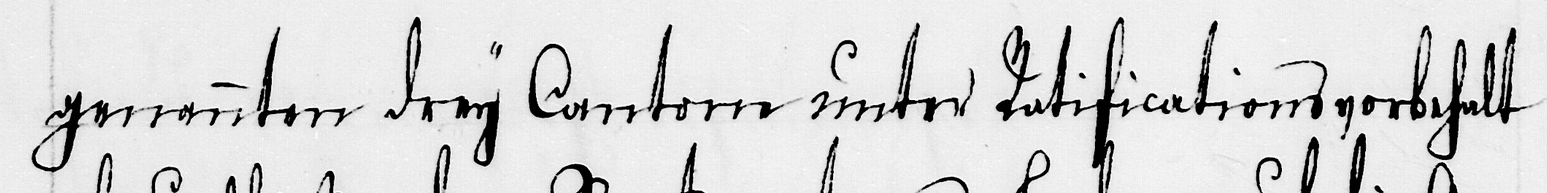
genannten drey Cantone unter Ratificationsvorbehalt
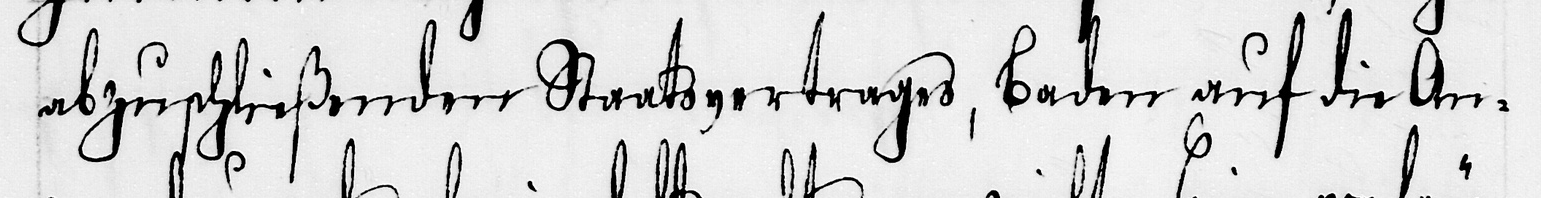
abzuschließenden Staatsvertrages, Baden auf die An¬
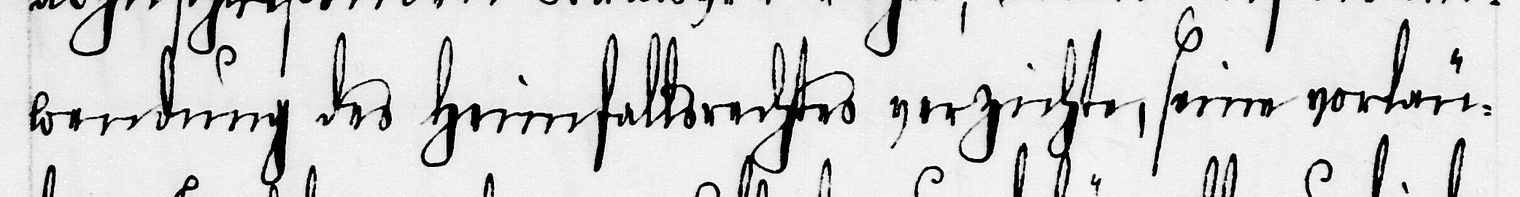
wendung des Heimfallsrechtes verzichte, seine vorläu¬
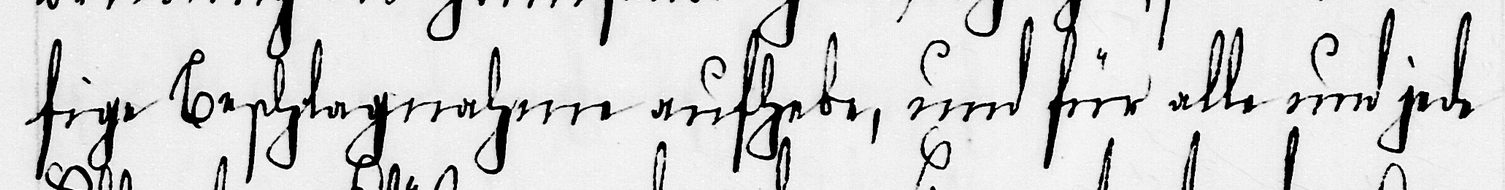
fige Beschlagnahme aufhebe, und für alle und jede
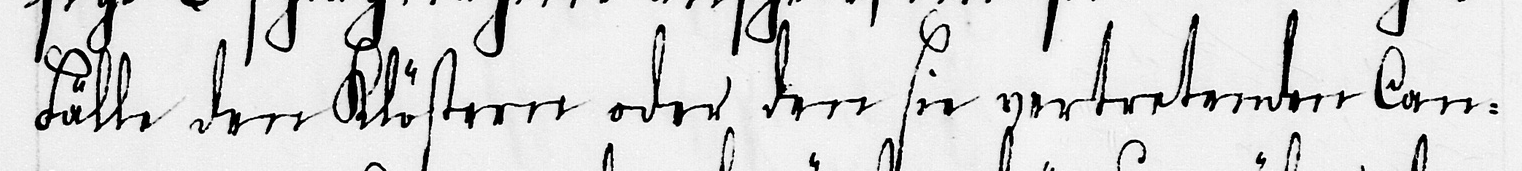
Fälle den Klöstern oder den sie vertretenden Can¬
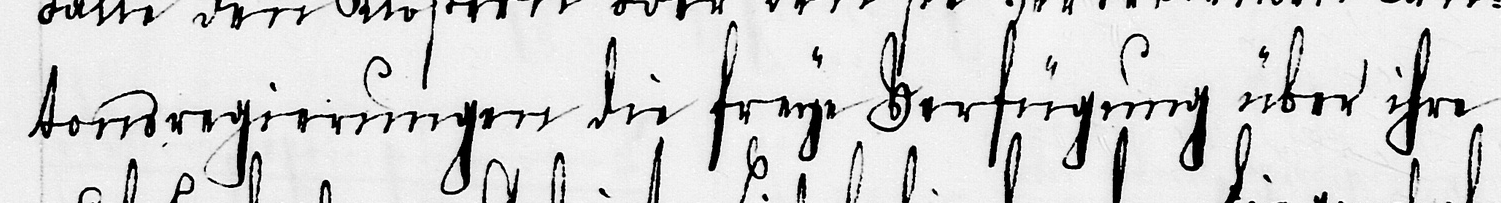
tonsregierungen die freye Verfügung über ihre
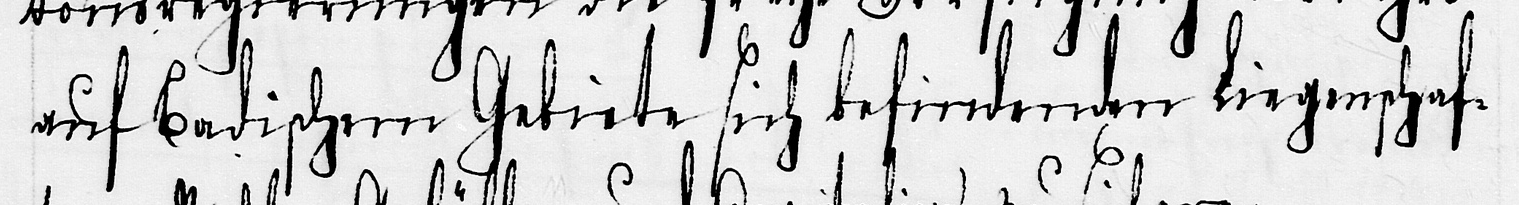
auf Badischem Gebiete sich befindenden Liegenschaf¬
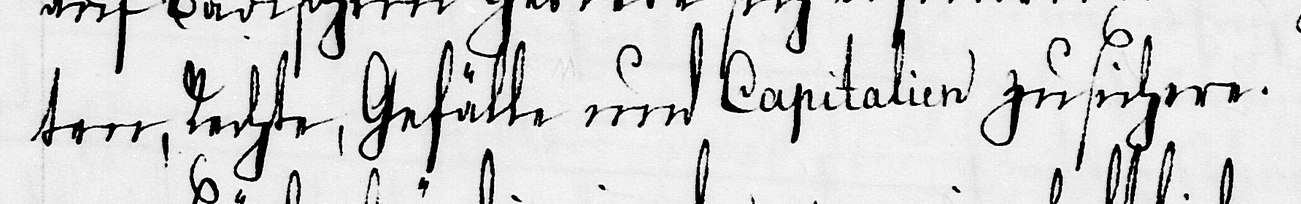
ten, Rechte, Gefälle und Capitalien zusichere.
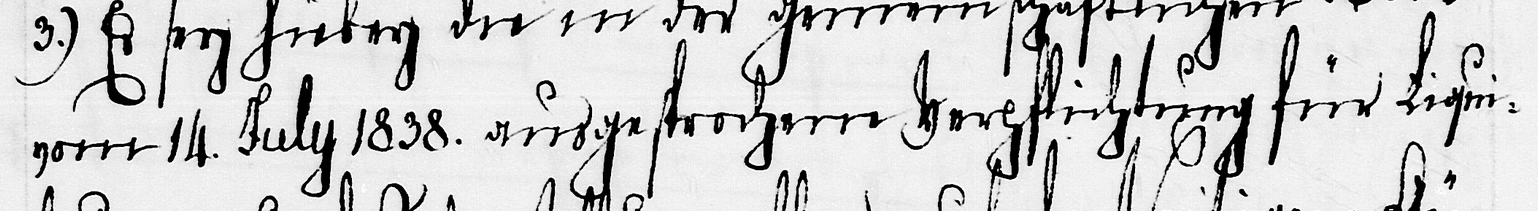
vom 14. July 1838. ausgesprochene Verpflichtung für Liqui¬
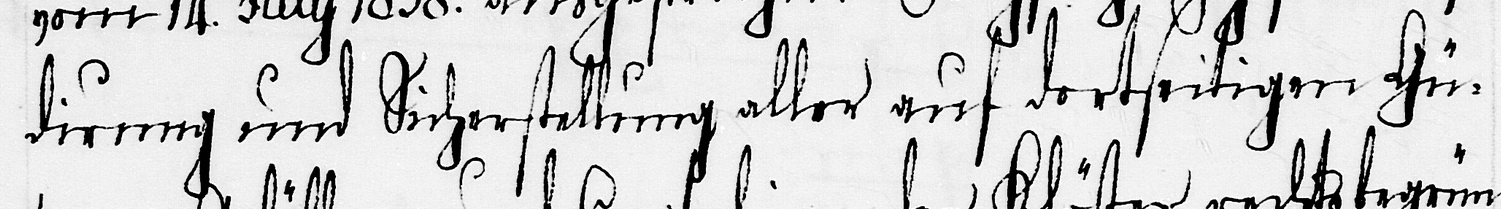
dirung und Sicherstellung aller auf dortseitigen Gü¬
